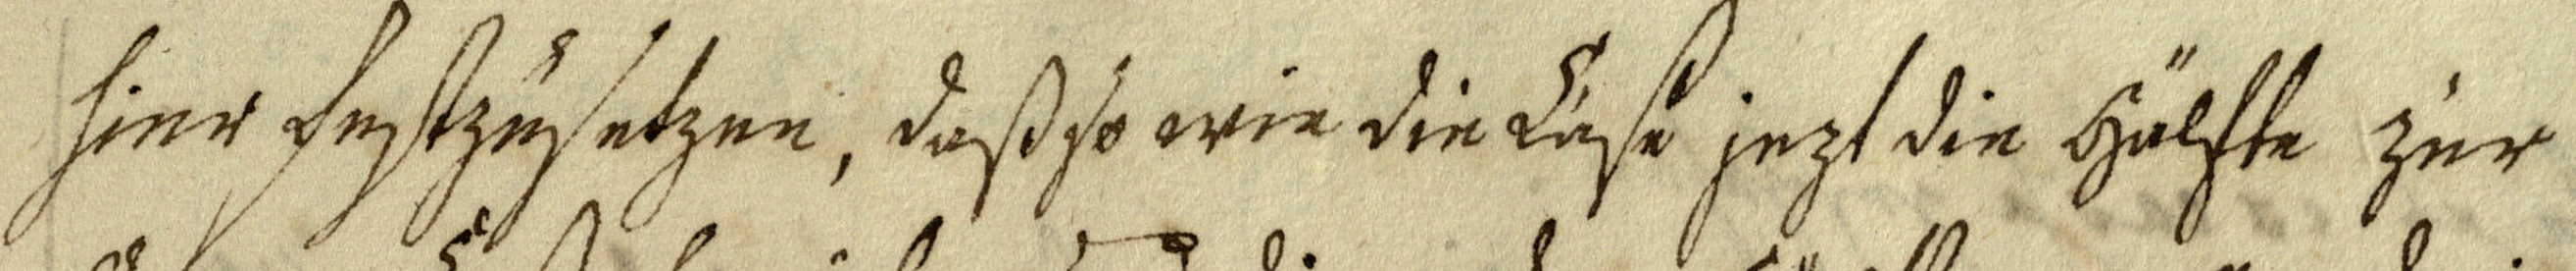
hier festzusetzen, daß so wie die Caße jezt die Hälfte zur
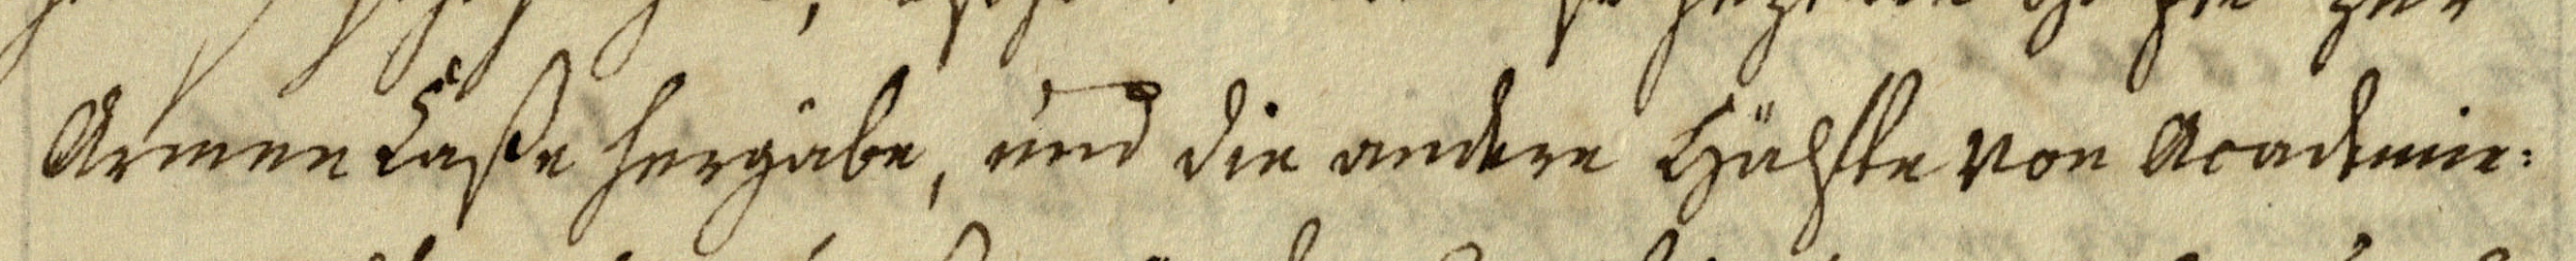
Armen Caße hergäbe, und die andere Hälfte von Academie¬
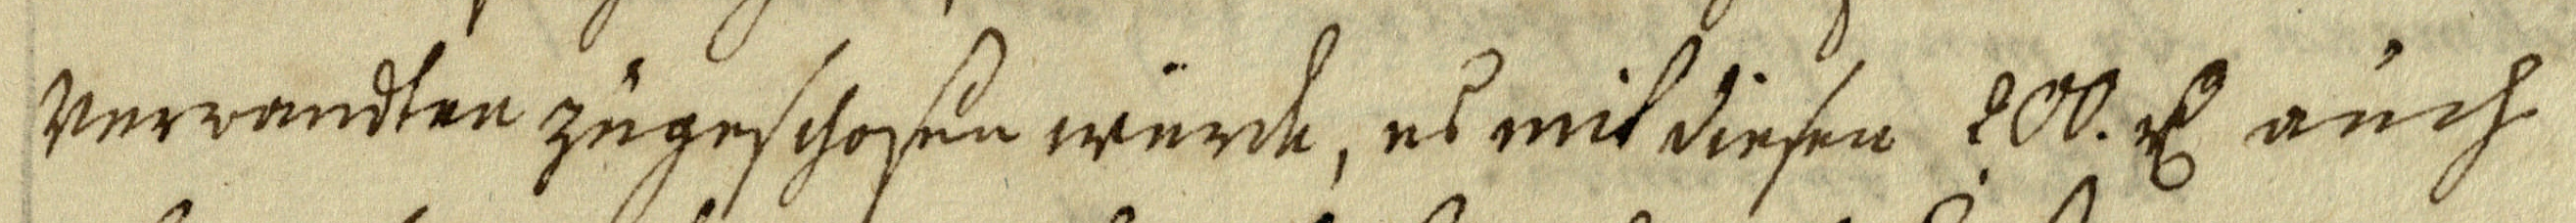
verwandten zugeschoßen würde, es mit diesen 200. r. auch
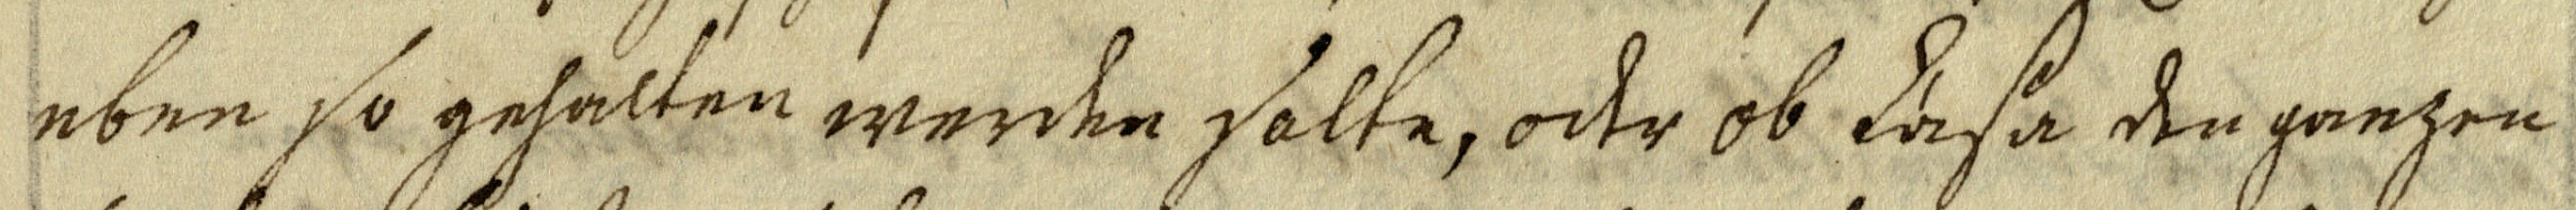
eben so gehalten werden solte, oder ob Caßa den ganzen
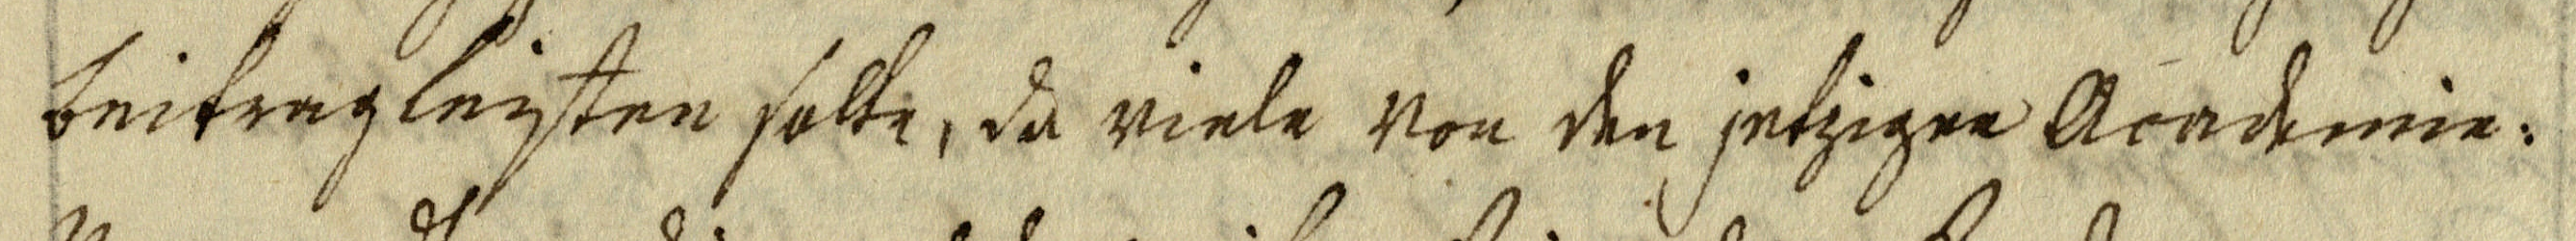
Beitrag leisten solte, da viele von jetzigen Academie¬
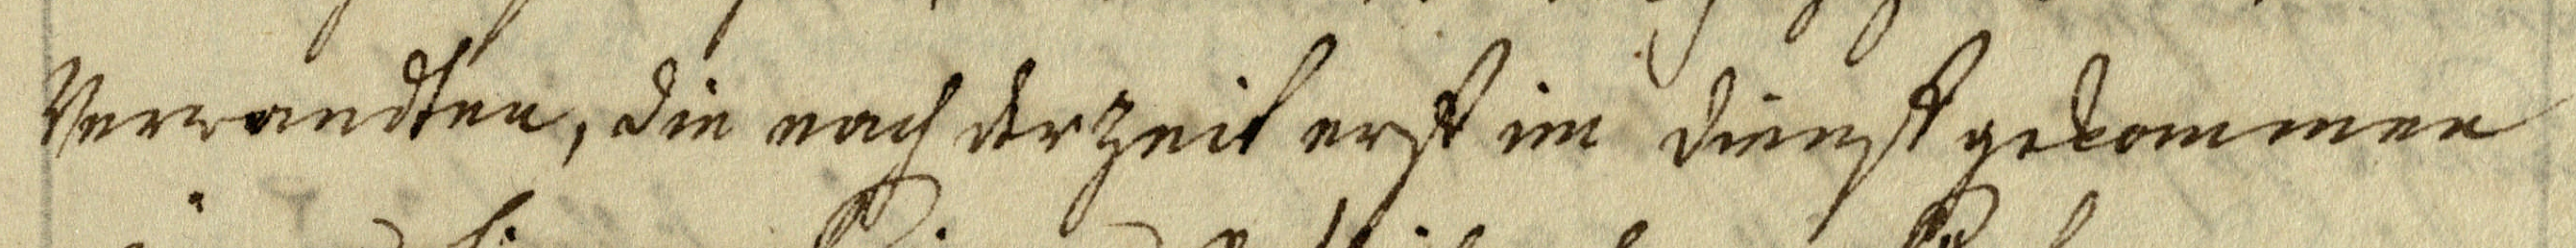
Verwandten, die nach der Zeit erst im Dienst gekommen
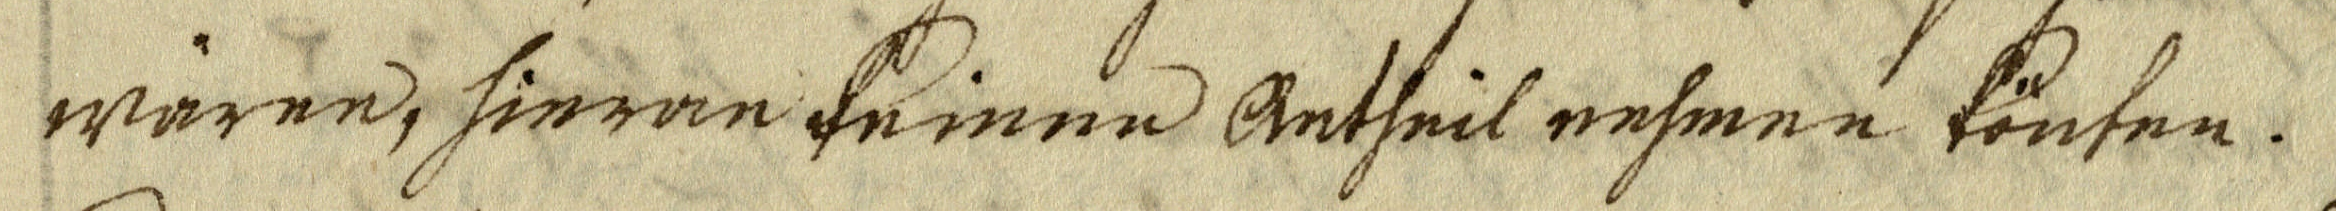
wären, hieran keinen Antheil nehmen könten.
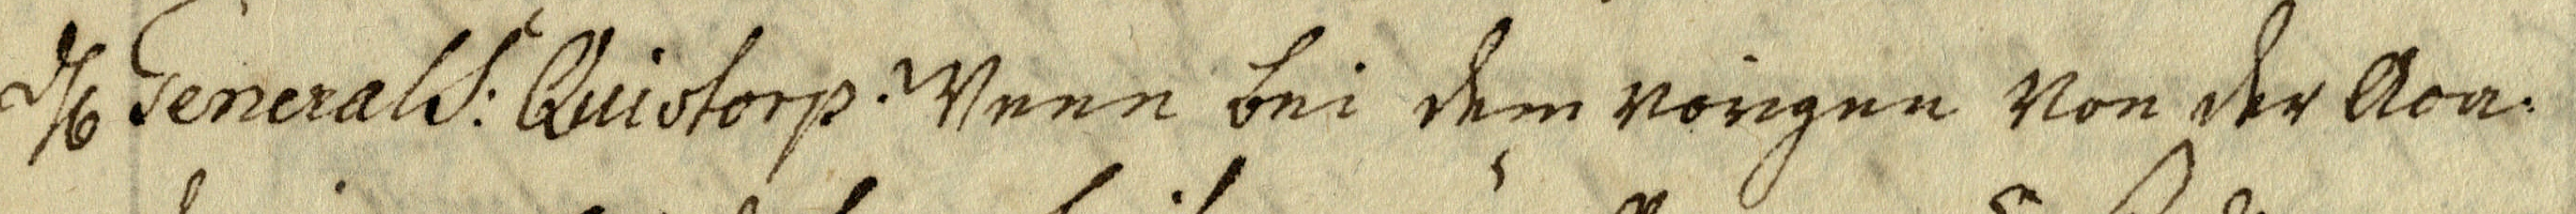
dh GeneralS: Quistorp. Wenn bei dem vorigen von der Aca¬
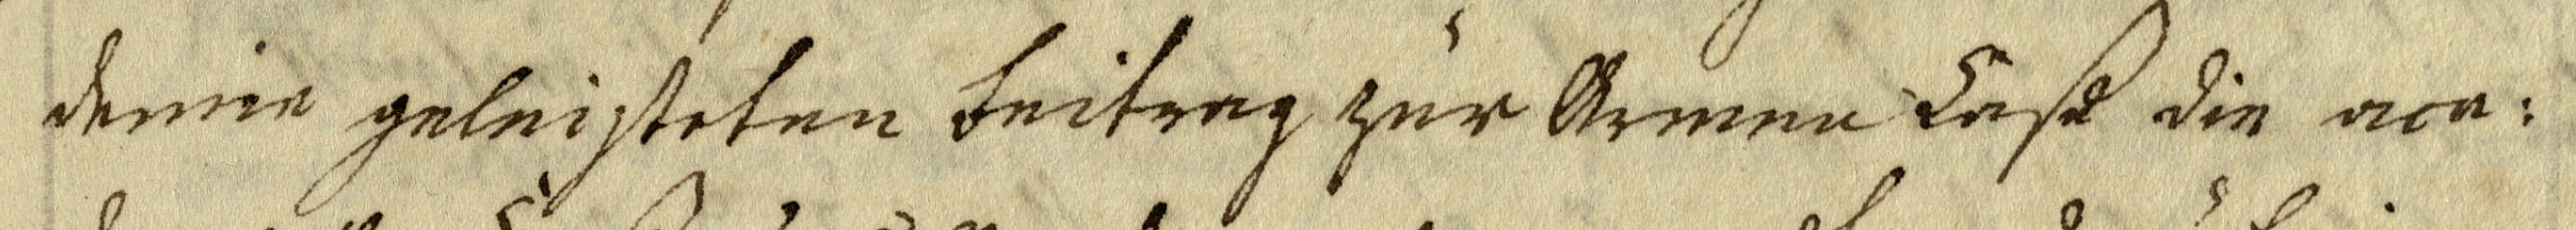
demie geleisteten Beitrag zur Armen Caße die aca¬
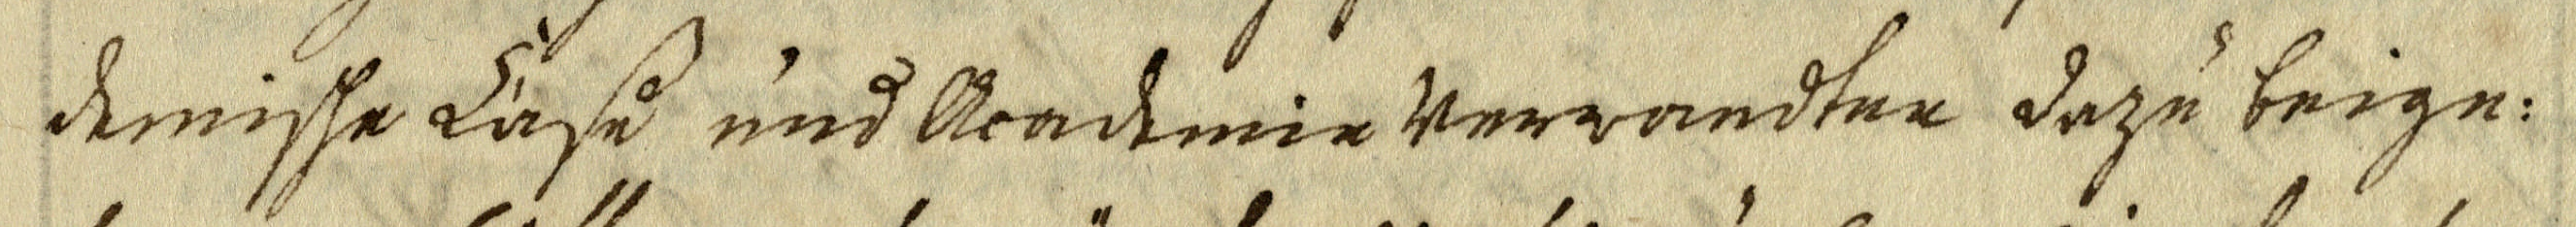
demische Caße und Academie Verwandten dazu beige¬
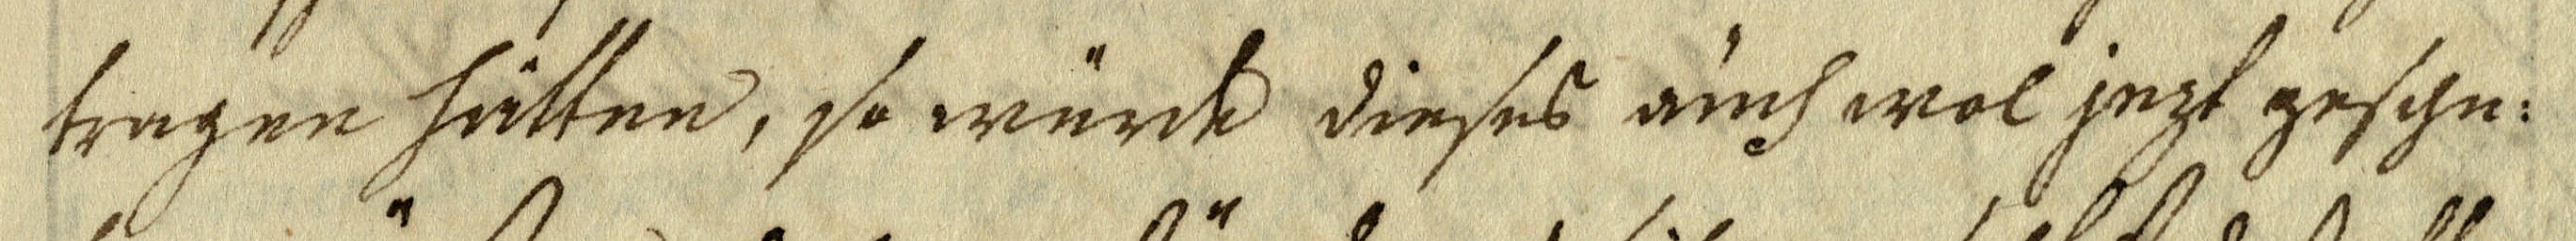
tragen hätten, so würde dieses auch wol jezt gesche¬
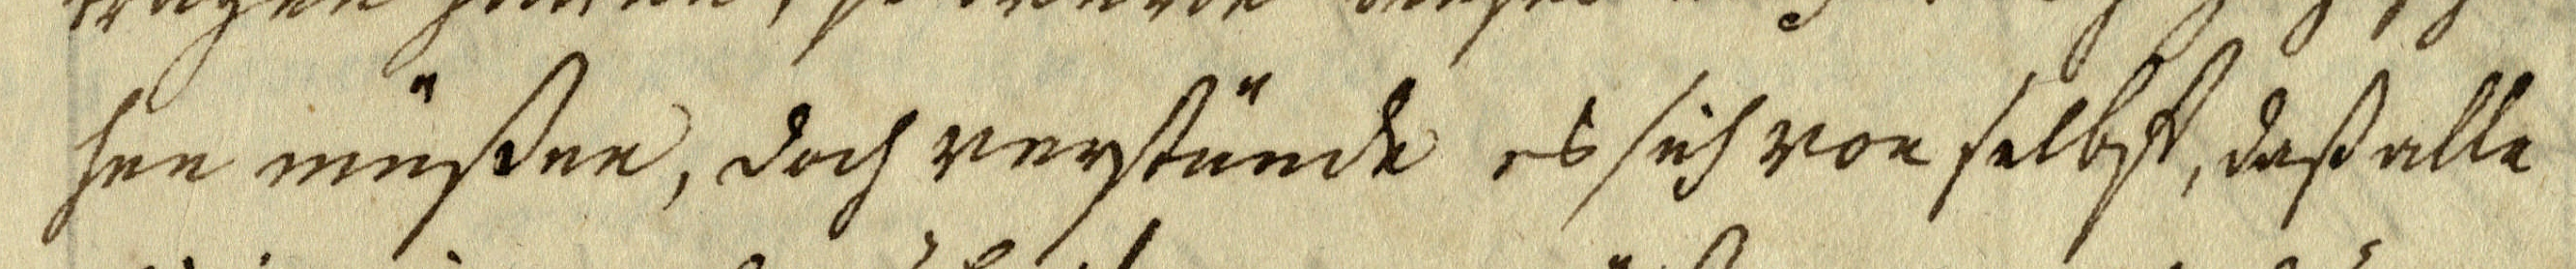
hen müßen, doch verstünde es sich von selbst, daß alle
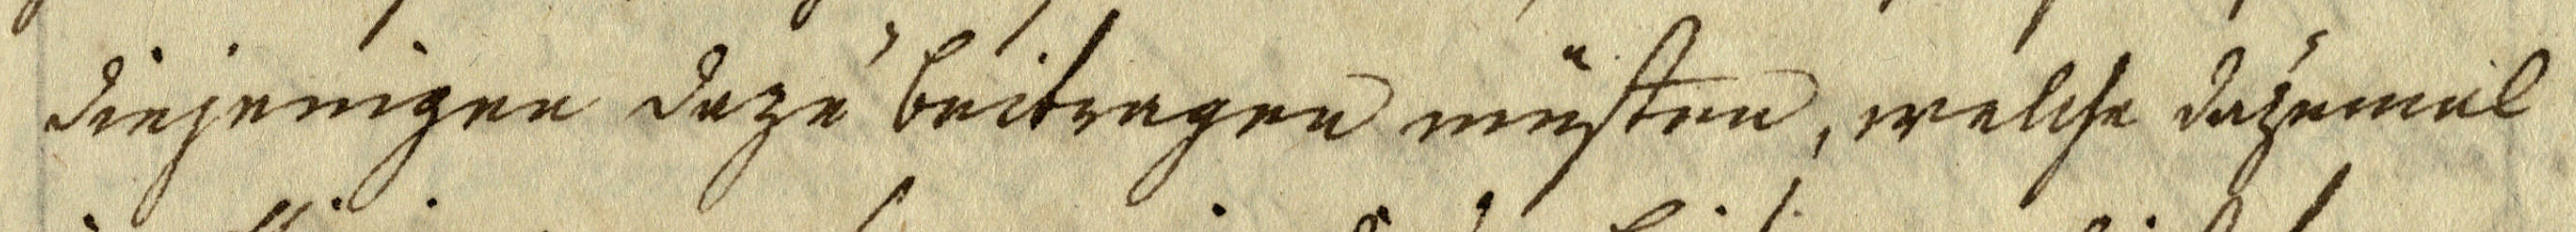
diejenigen dazu beitragen müsten, welche dazumal
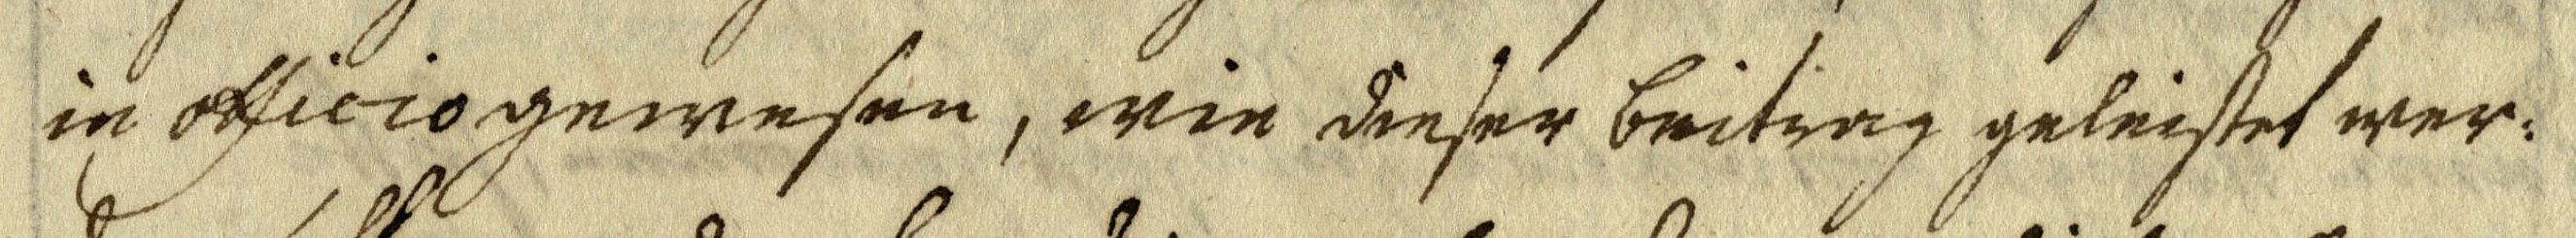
in officio gewesen, wie dieser Beitrag geleistet wer¬
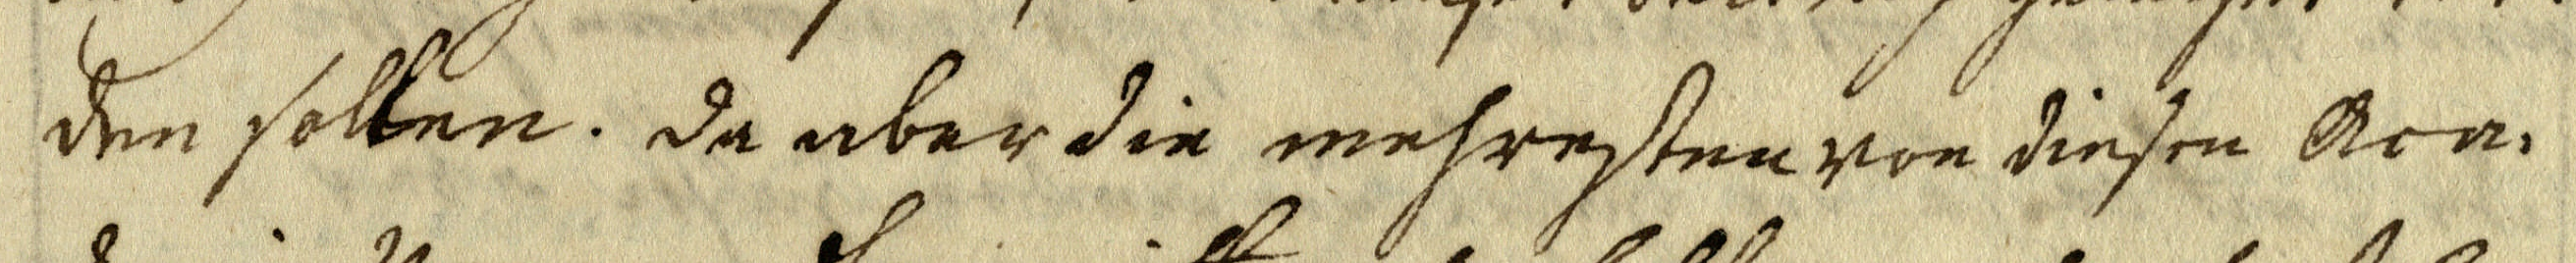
den sollen. da aber ide mehresten von diesen Aca¬
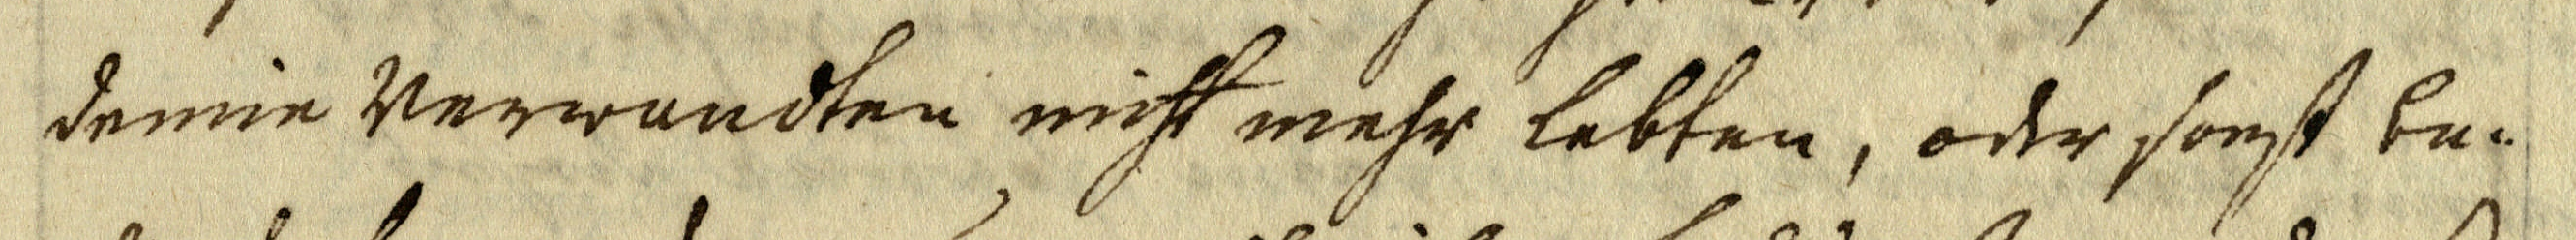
demi Verwandten nicht mehr lebten, oder sonst be¬
